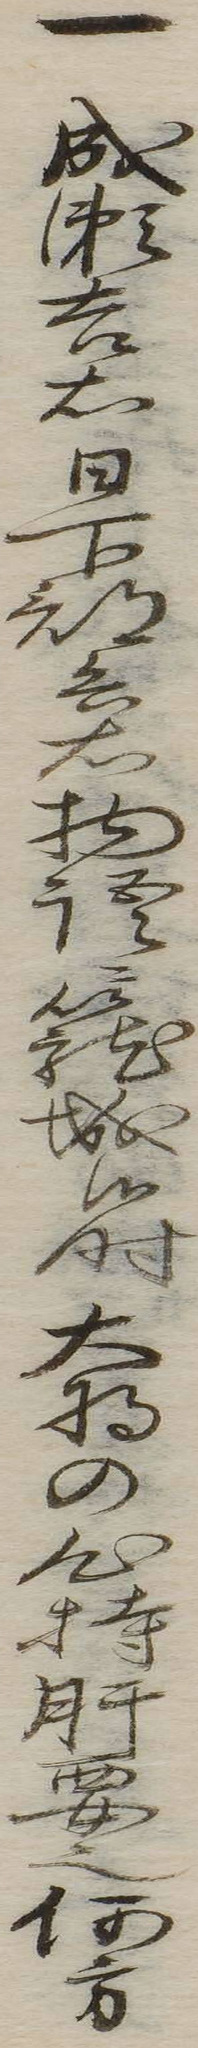一成瀬吉右日下部兵右物語ニ籠城候時大将の心持肝要也何方
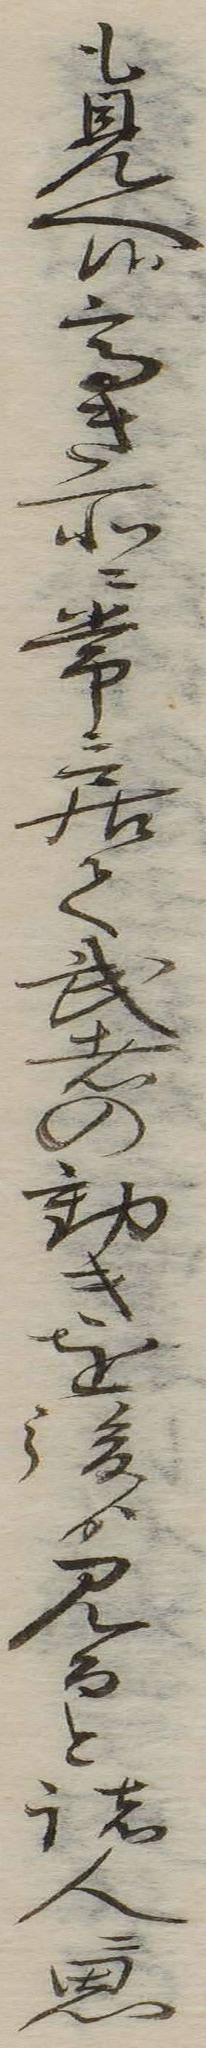も見へ候高き所に常ニ居て武者の動きを後ゟ見ると諸人ニ思
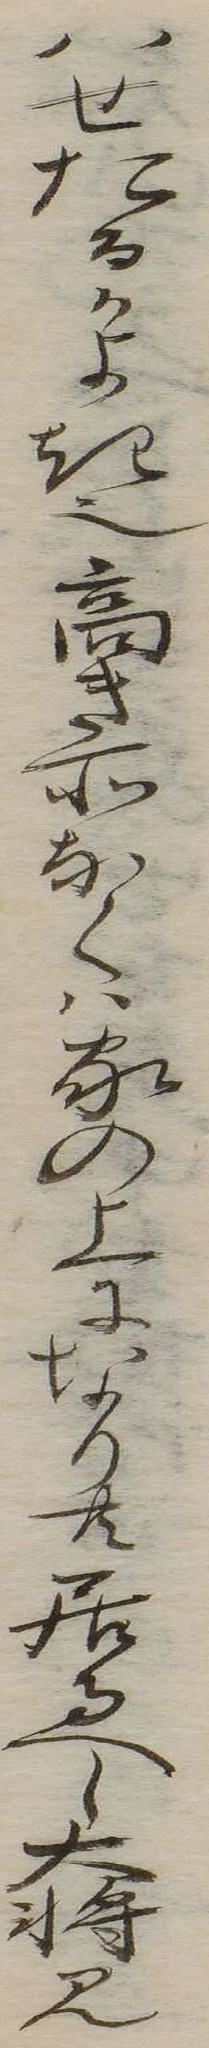はせたるかよき也高き所なくは家の上になり共居るへし大将見
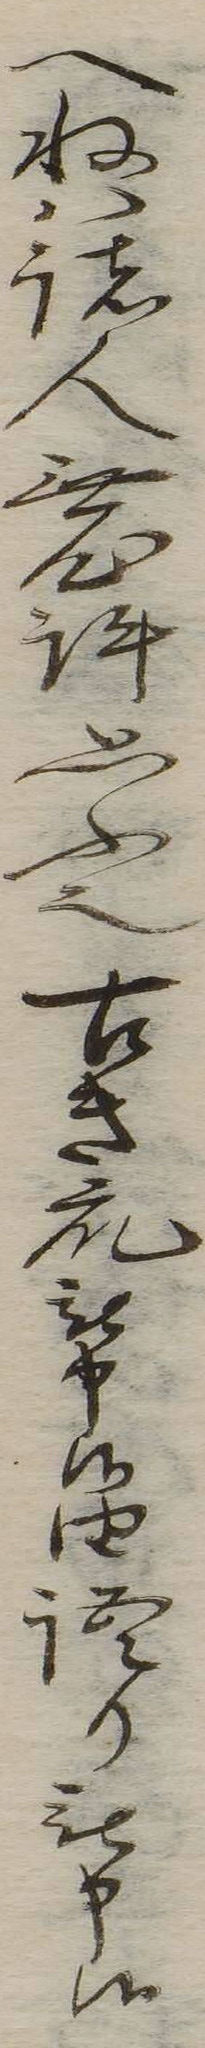へねは諸人無心評思ふ也古き衆被申候由語り被申候
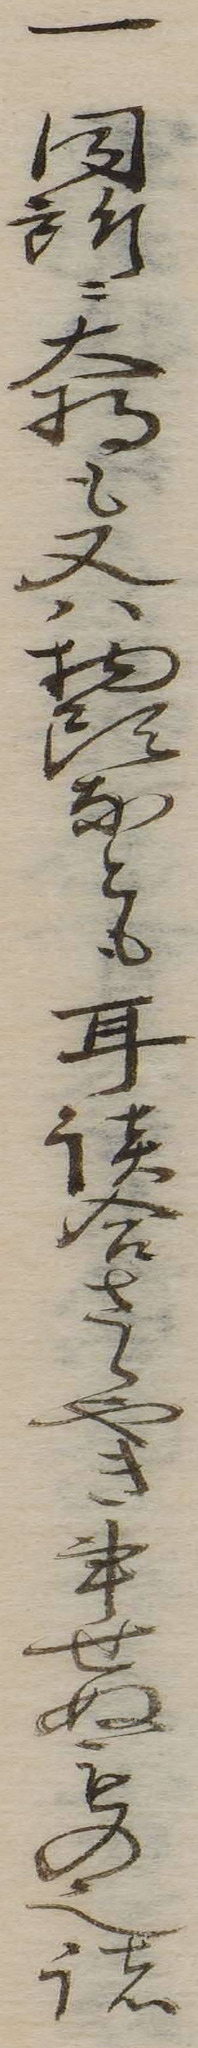一同訴ニ大将も又は物頭なとも耳談合さゝやき事せぬもの也諸

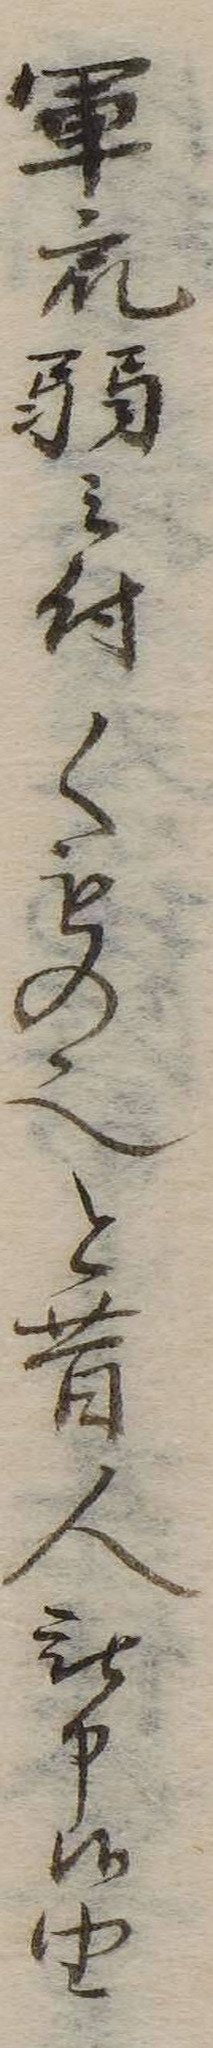軍衆弱み付くもの也と昔人被申候由
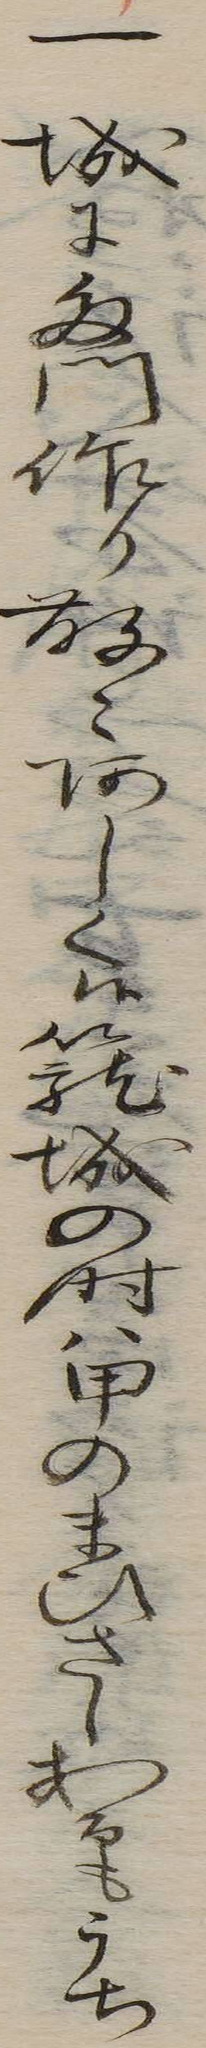一城に多門作り散々あしく候籠城の時は甲のまひさしあるもうち
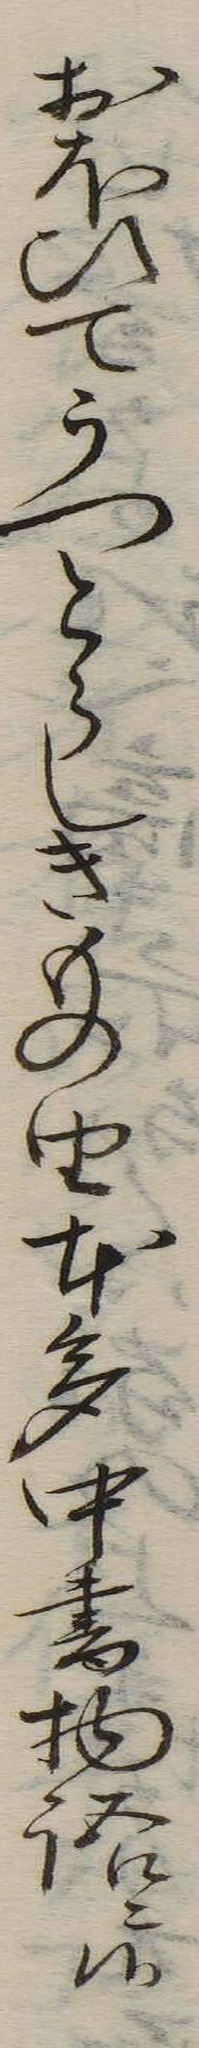おほひてうつとうしきもの由本多中書物語ニ候
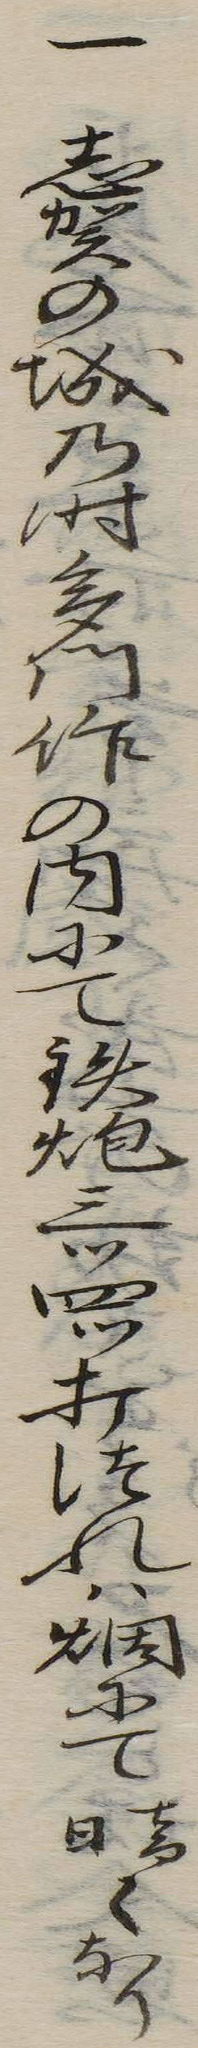志賀の城の時多門作の内にて鉄炮三ツ四ツ打つれは烟にて暗くなり
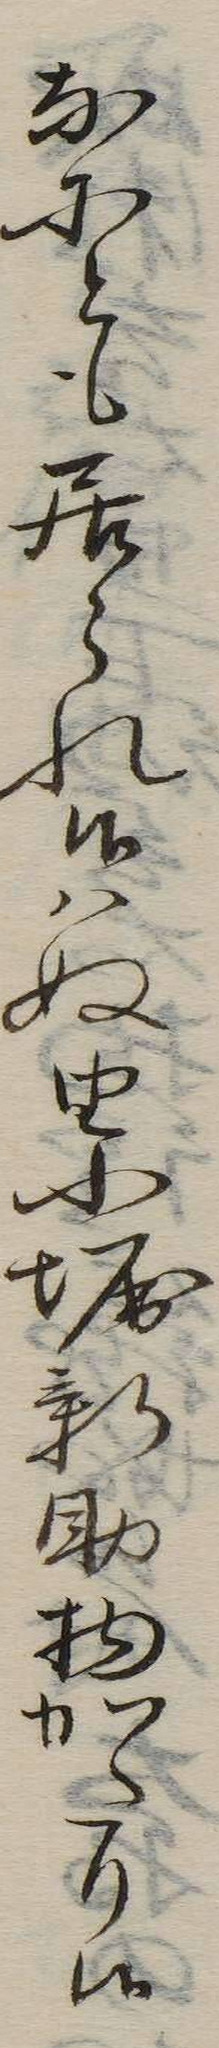なにとも居られ候はぬ由小堀新助物かたり候
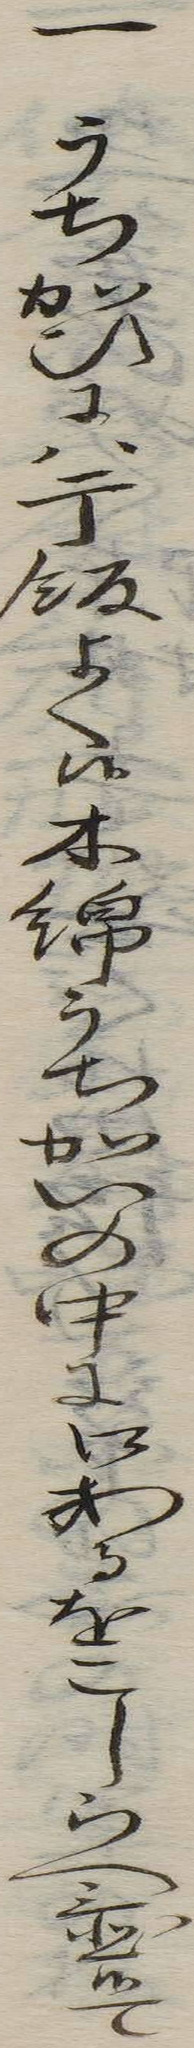一うちかひには干飯よく候木綿うちかいの中に口あるをこしらへ置候て
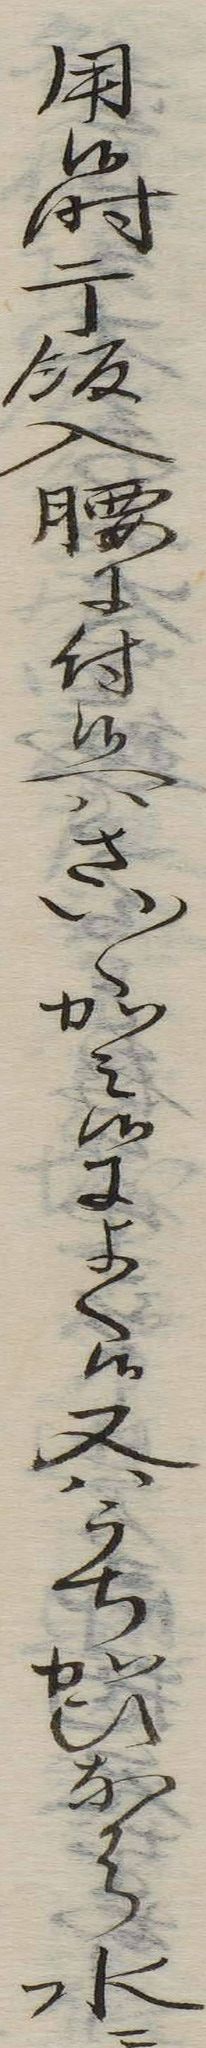用候時干飯入腰に付候へはさい〳〵かみ候によく候又はうちかひなから水ニ
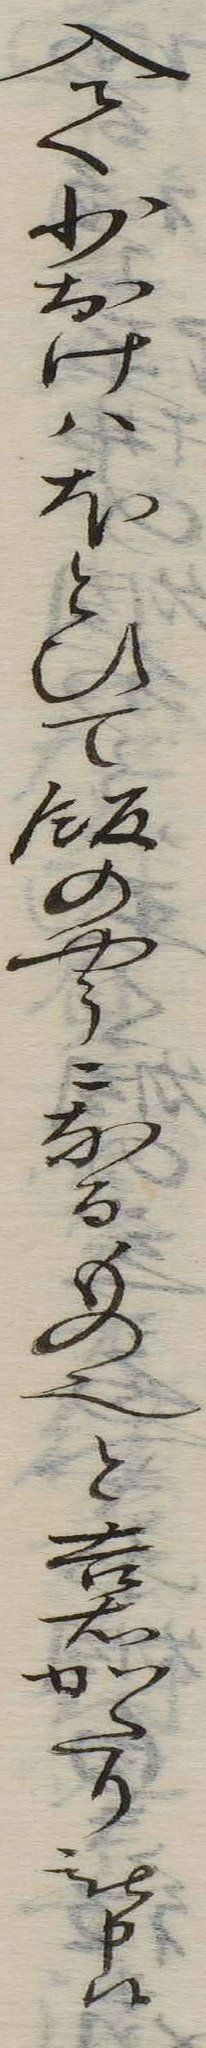入て少おけはほとひて飯のやうニなるもの也と吉右かたり被申候
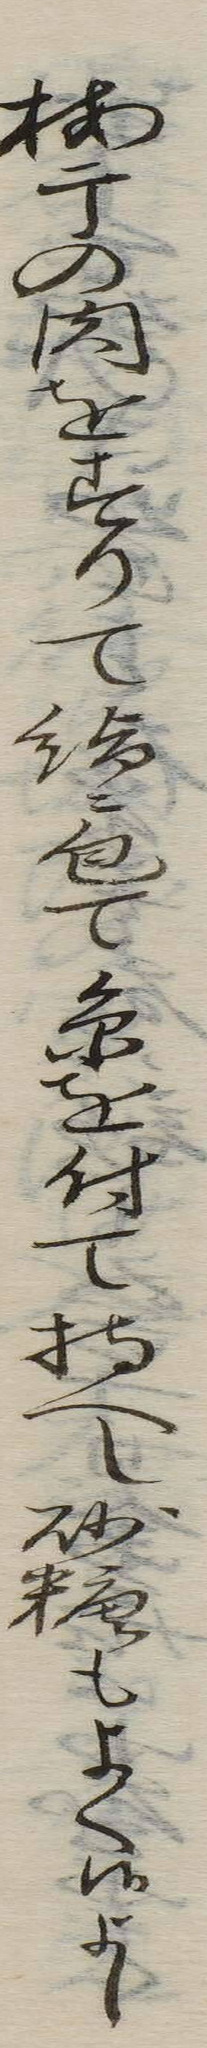一梅干の肉をすりて絹ニ包て糸を付て持へし砂糖もよく候よし
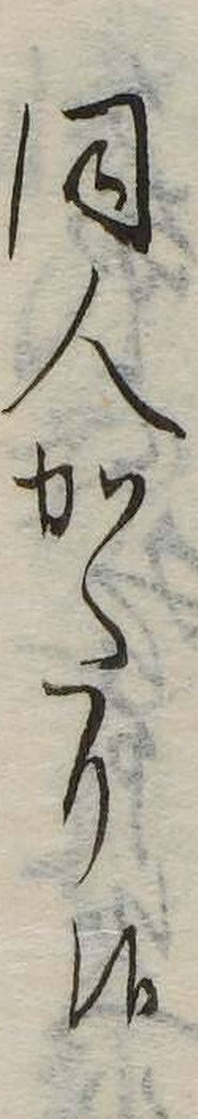同人かたり候
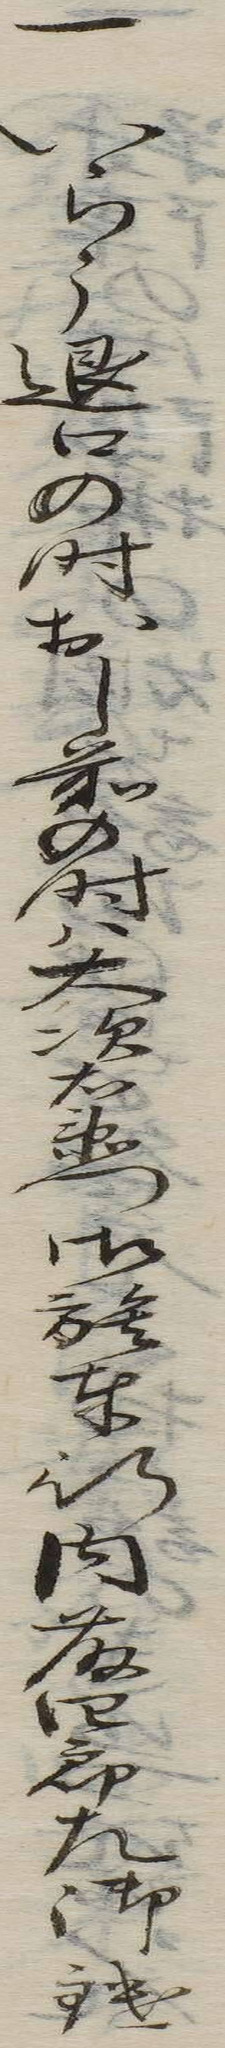一いらう退口の時おし前の時は大次右衛門御旗本行内藤四郎左御鑓
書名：三河之物語
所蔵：国文学研究資料館
